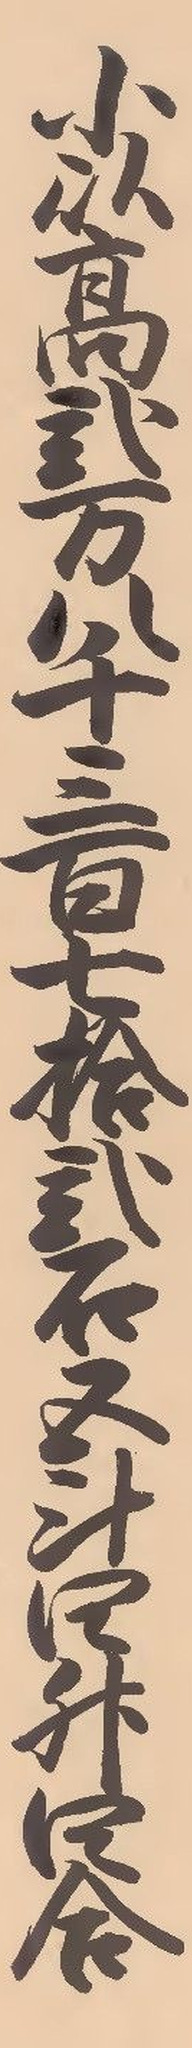小以高弐万八千三百七拾弐石五斗四升四合

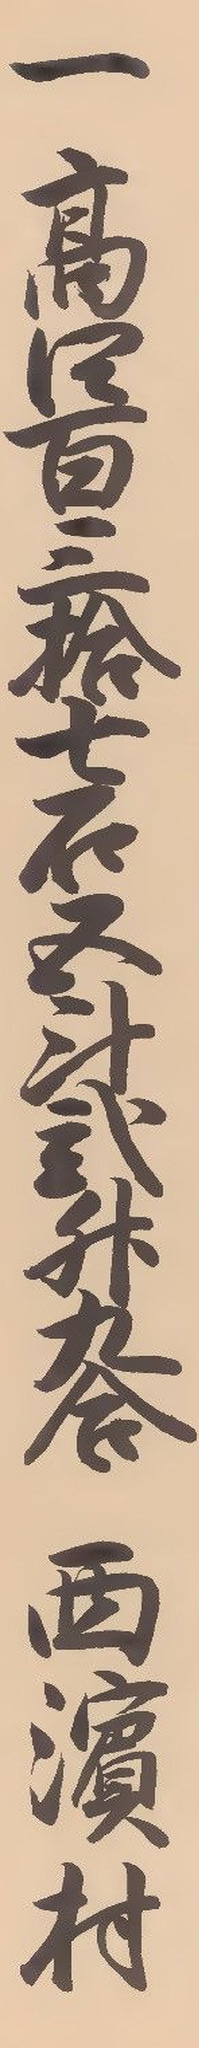一高四百三拾七石五斗弐升九合西浜村
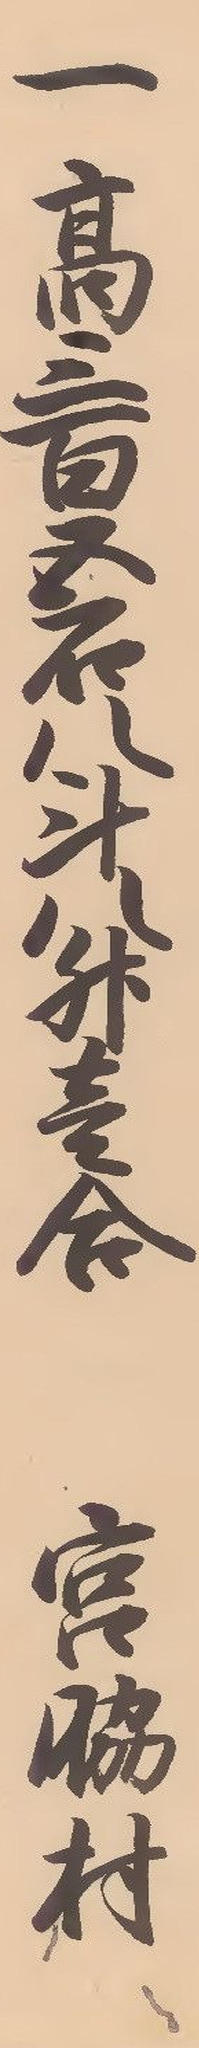一高三百五石八斗八升壱合宮脇村
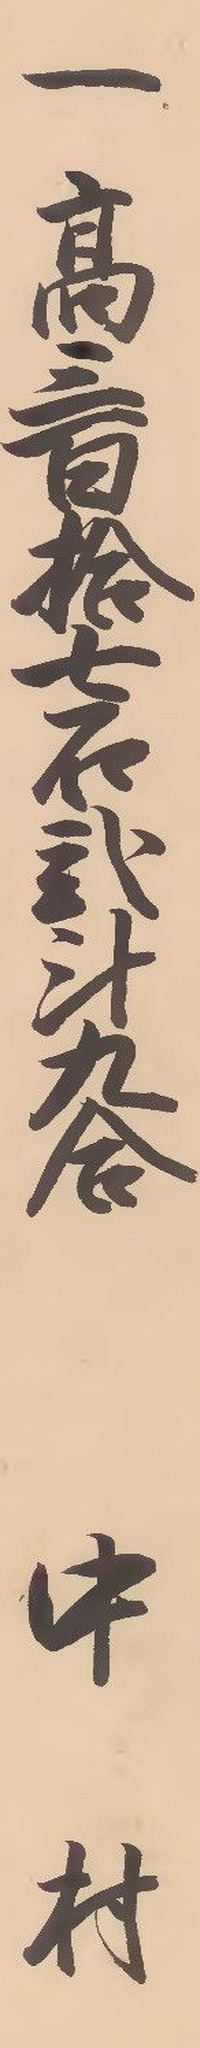一高三百拾七石弐斗九合中村
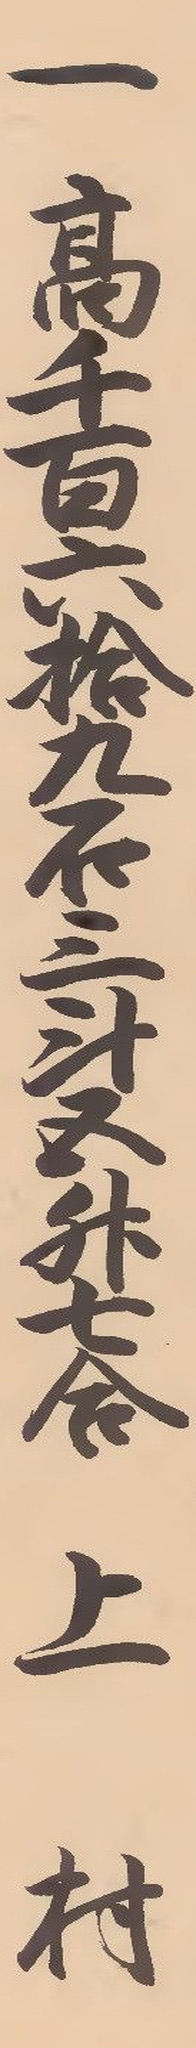一高千百六拾九石三斗五升七合上村
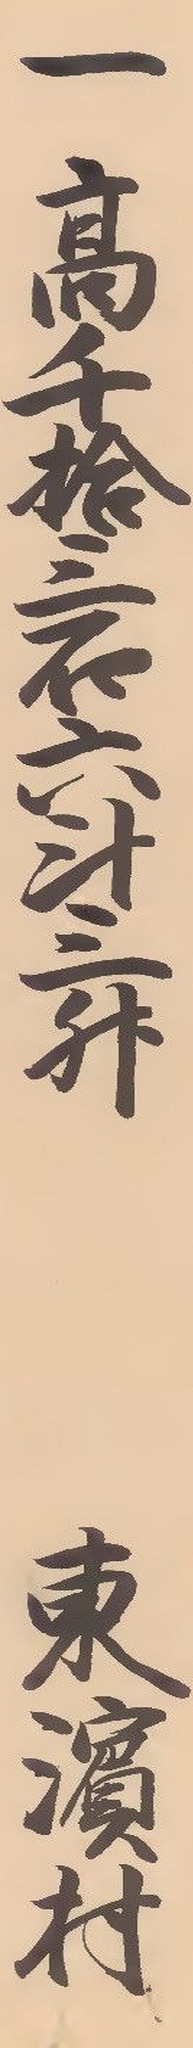一高千拾三石六斗三升東浜村
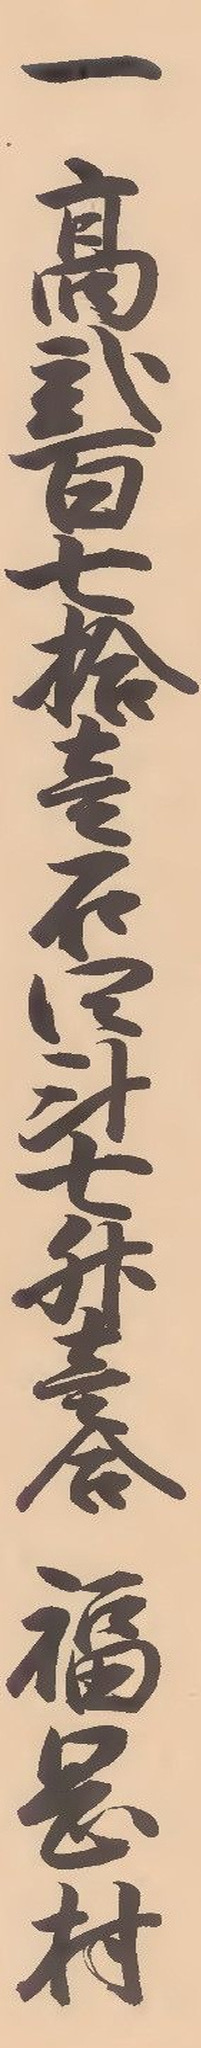一高弐百七拾壱石四斗七升壱合福岡村
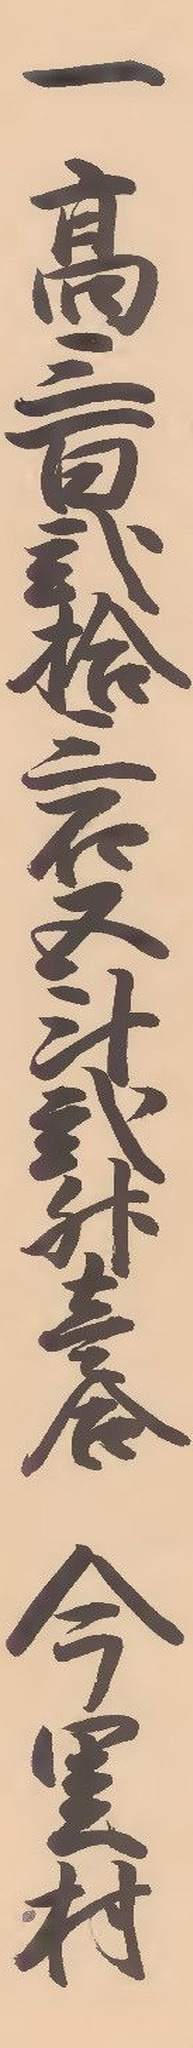一高三百弐拾三石五斗弐升壱合今里村

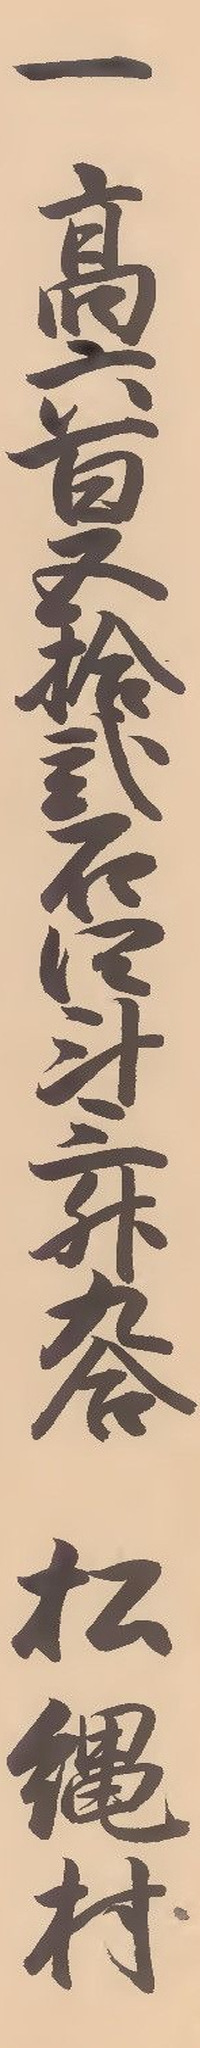一高六百五拾弐石四斗三升九合松縄村
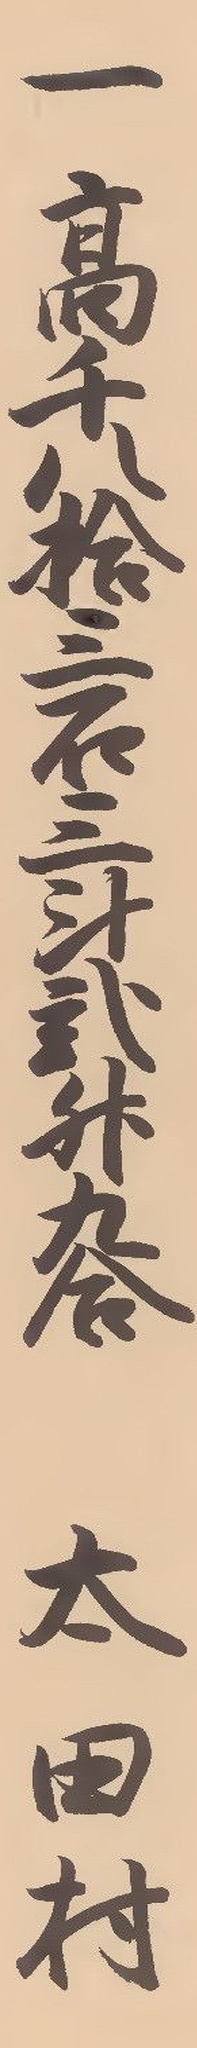一高千八拾三石三斗弐升九合太田村
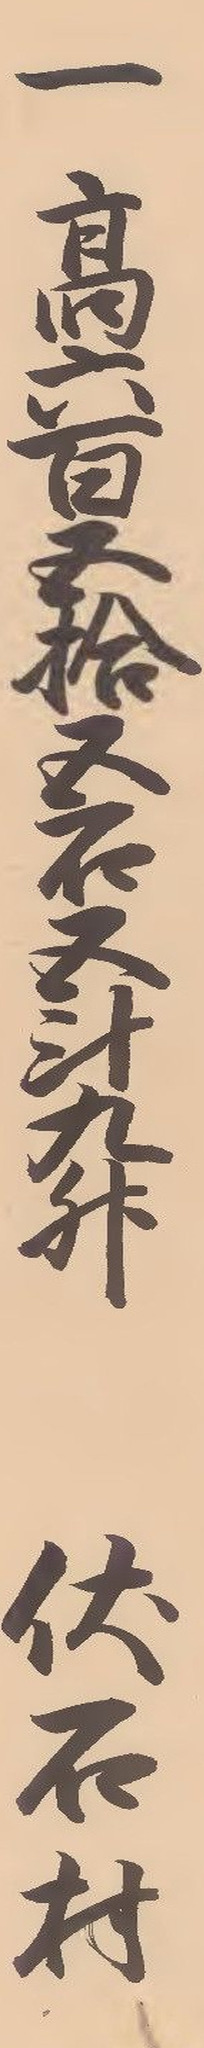一高六百五拾五石五斗九升伏石村
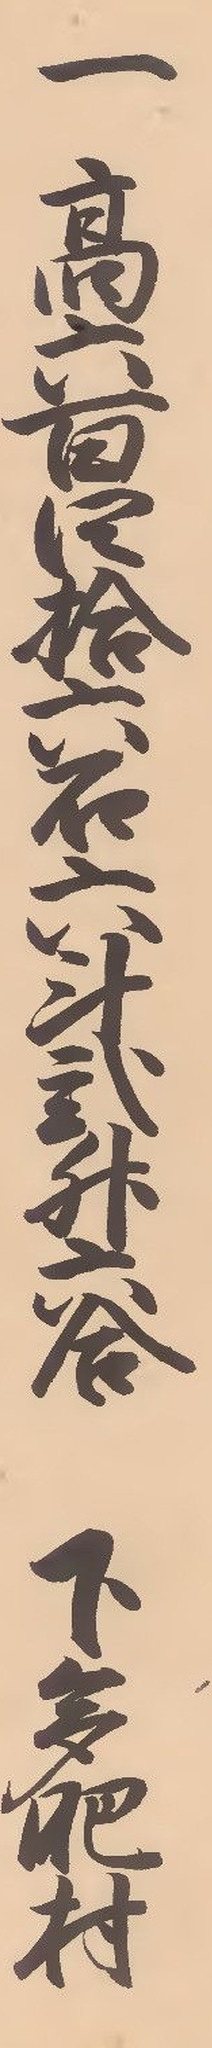一高六百四拾六石六斗弐升六合下多肥村
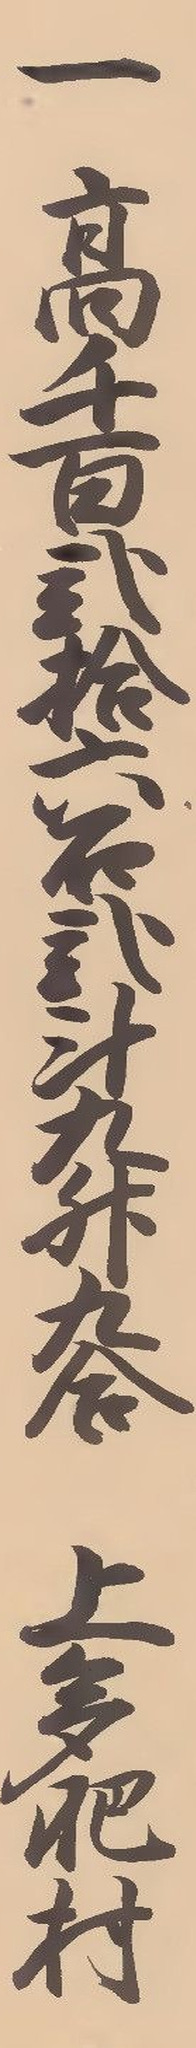一高千百弐拾六石弐斗九升九合上多肥村
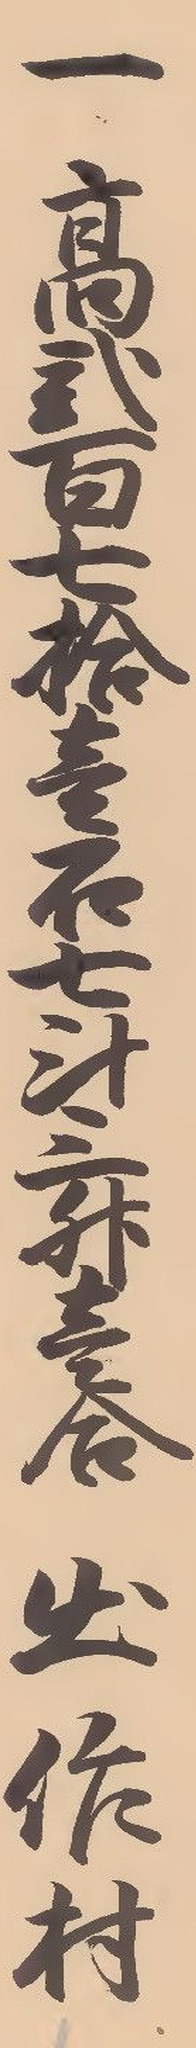一高弐百七拾壱石七斗三升壱合出作村
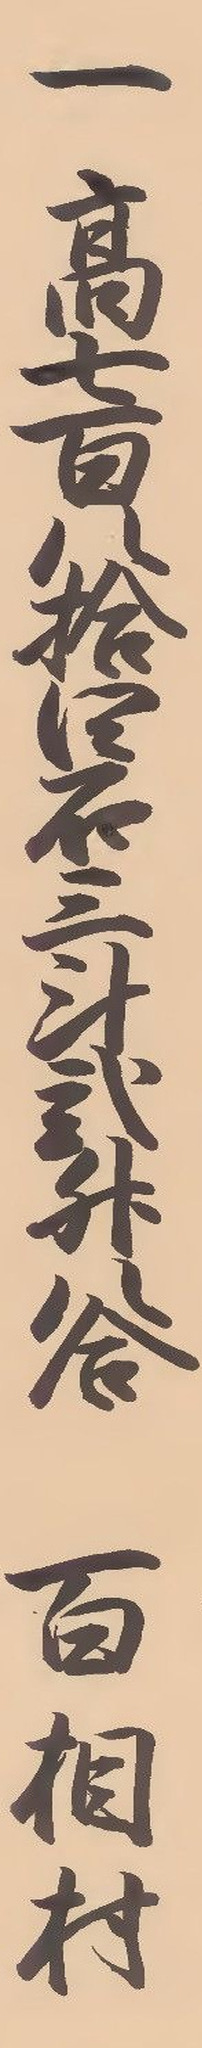一高七百八拾四石三斗弐升八合百相村
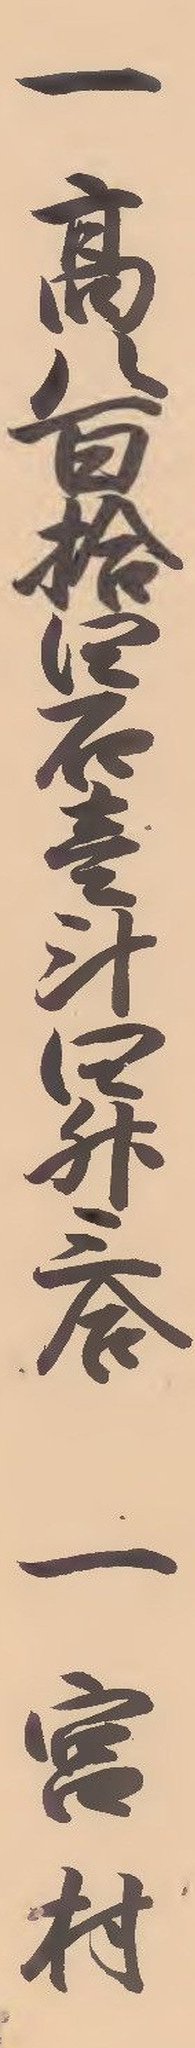一高八百拾四石壱斗四升三合一宮村
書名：讃岐国郷帳
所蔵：国立公文書館 National Archives of Japan
